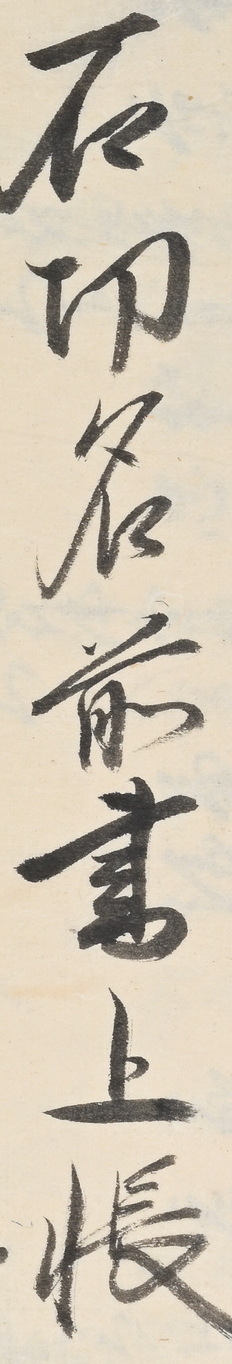石切名前書上帳

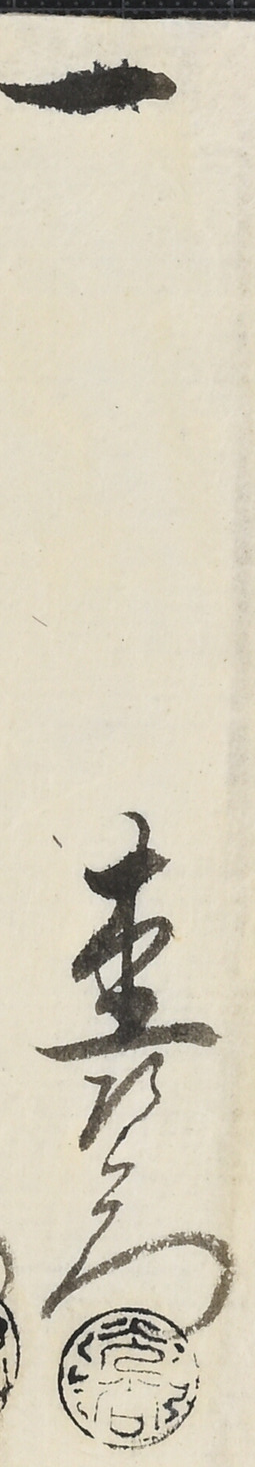一杢左衛門
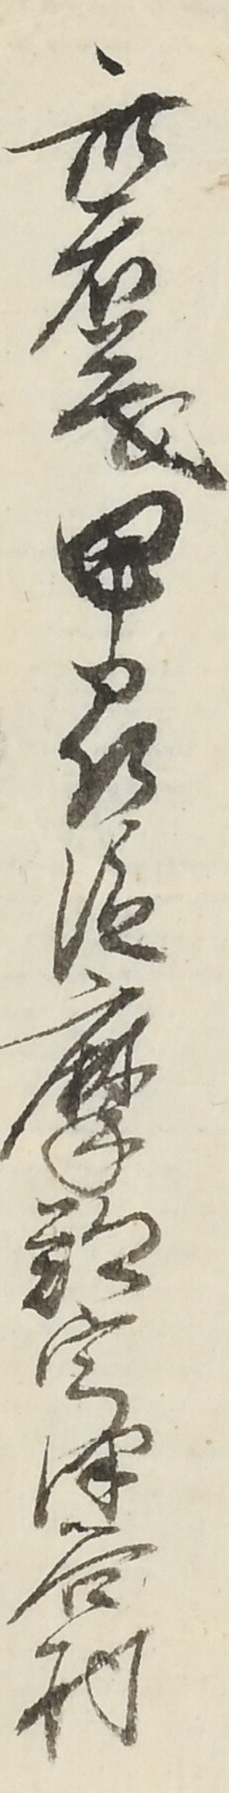此者義甲州巨摩郡宇津谷村
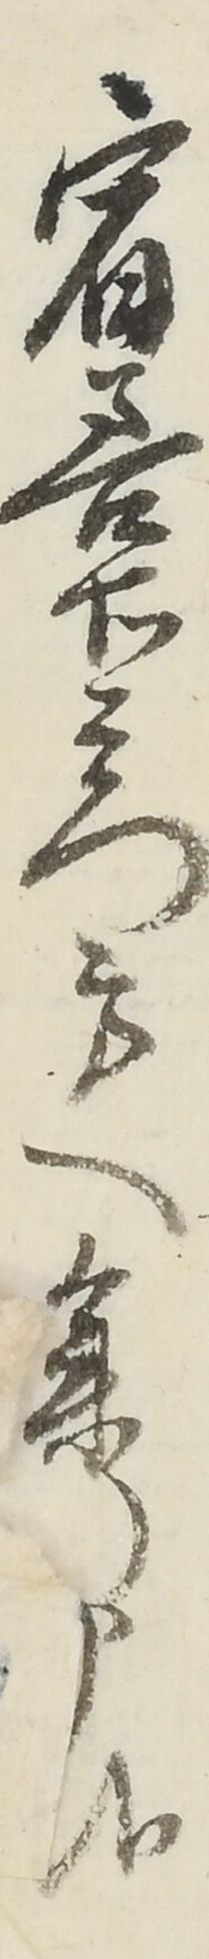宿善右衛門方へ参り申候
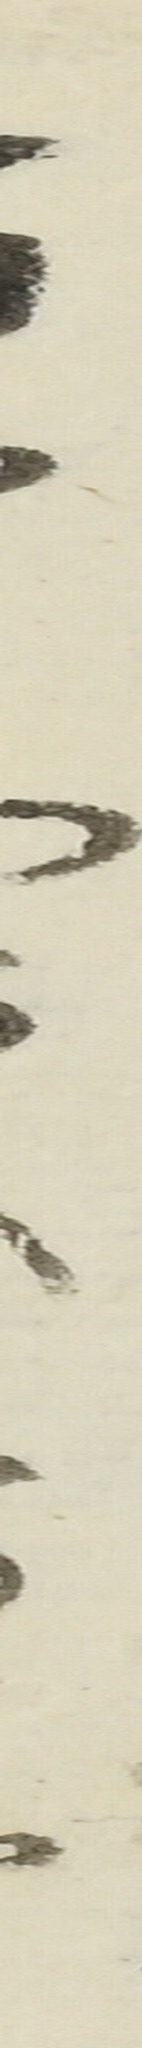宿善右衛門方へ参り申候
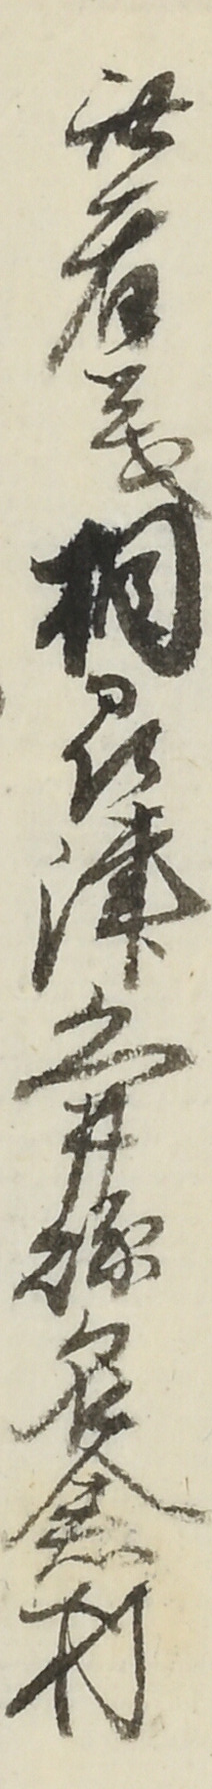此者義相州津久井県名倉村

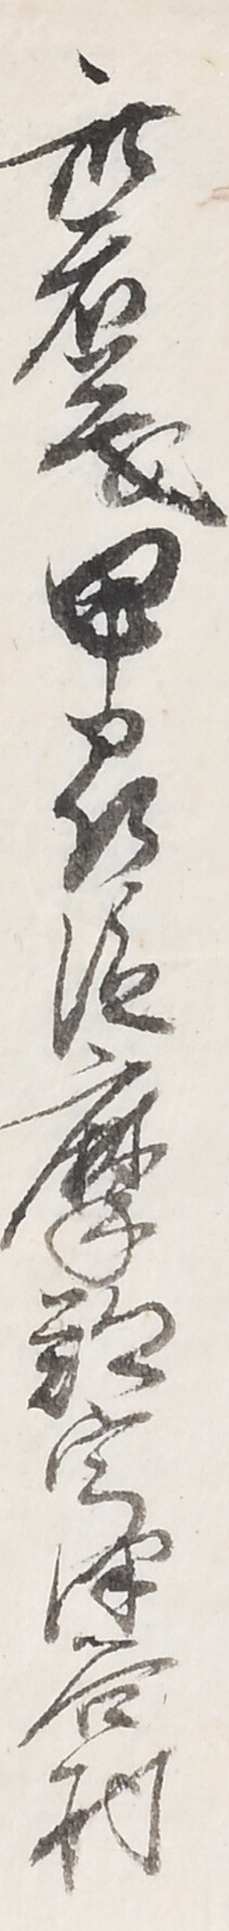此者義甲州巨摩郡宇津谷村
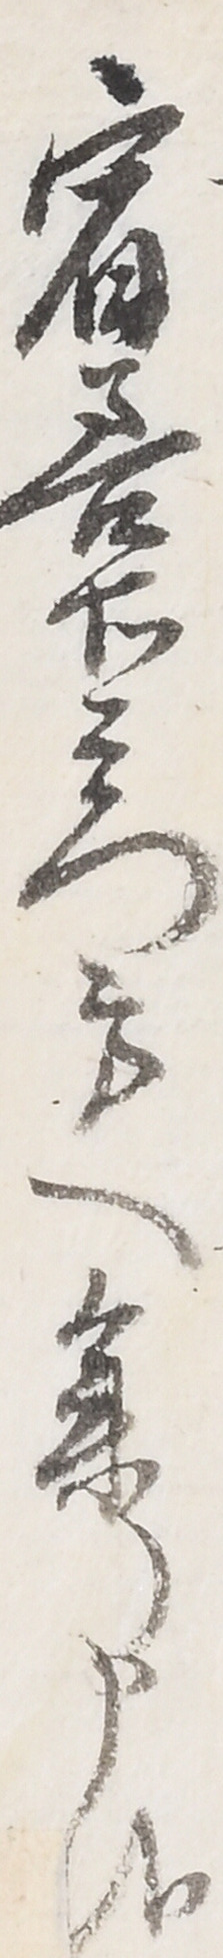宿善右衛門方へ参り申候
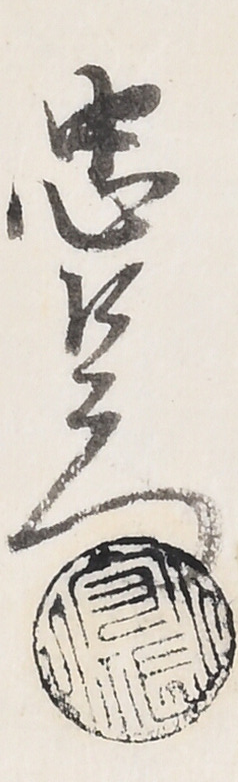忠右衛門
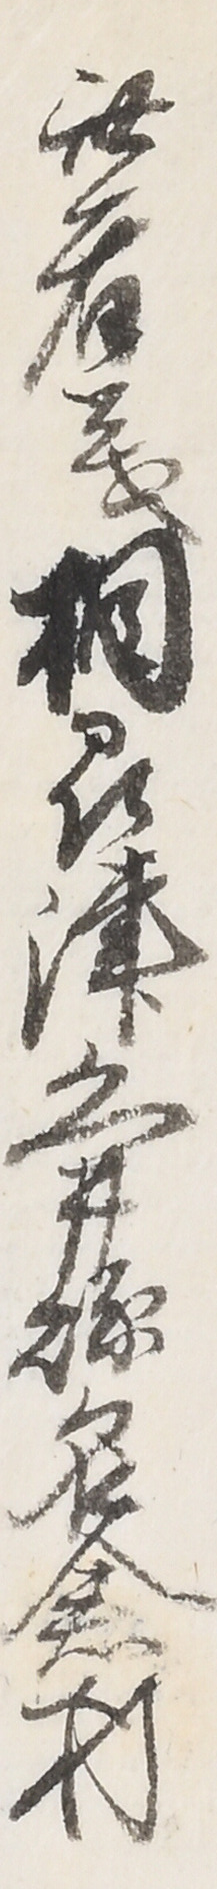此者義相州津久井県名倉村
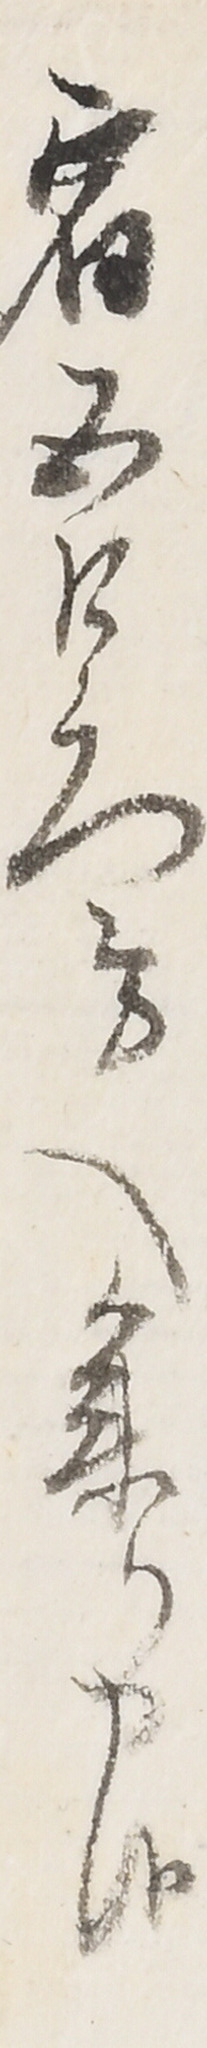宿五右衛門方へ参り申候
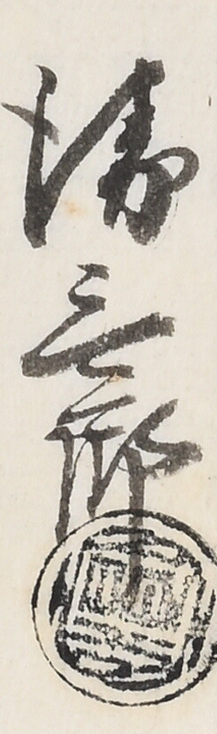衛三郎
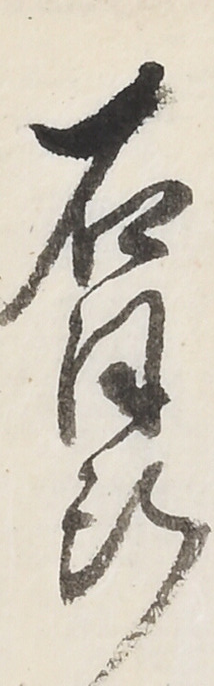右同断
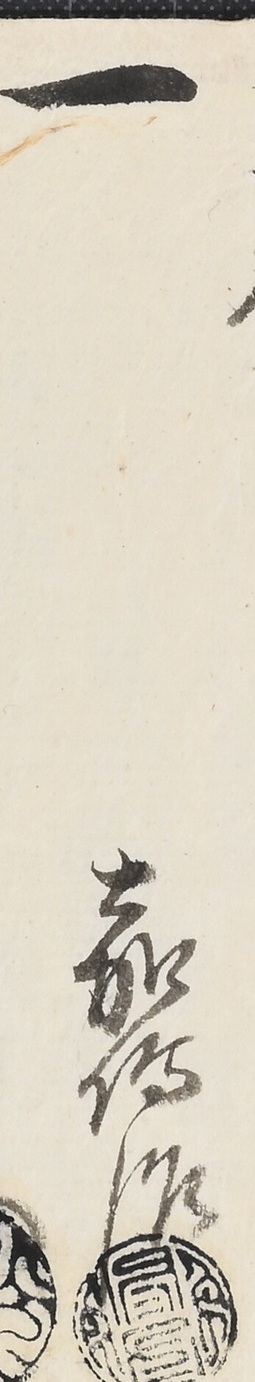一杢左衛門
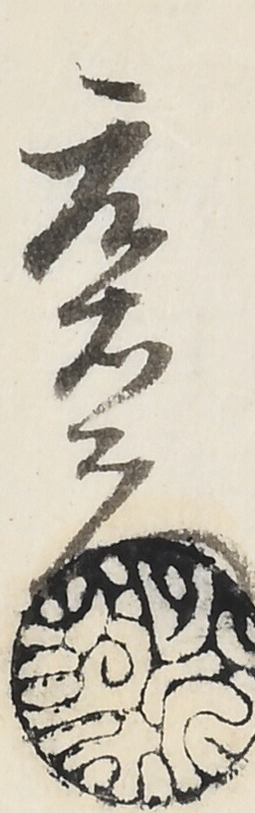谷右衛門
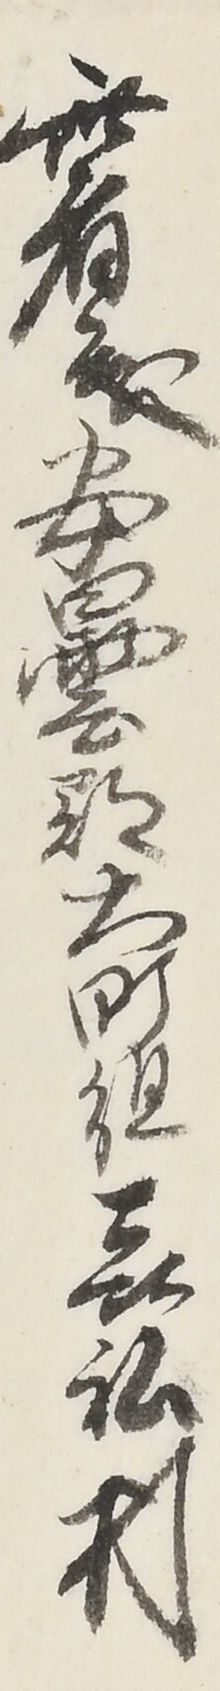此者義安曇郡大町組喜船村
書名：安政六己未年二月日石切名前書上帳
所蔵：伊那市立高遠町図書館・合同会社AMANE
